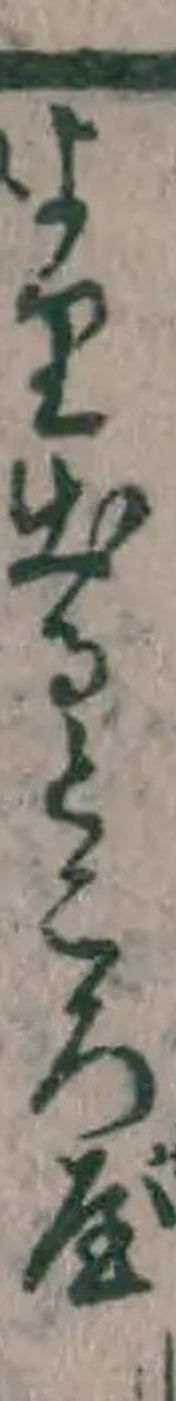より出るところ屋
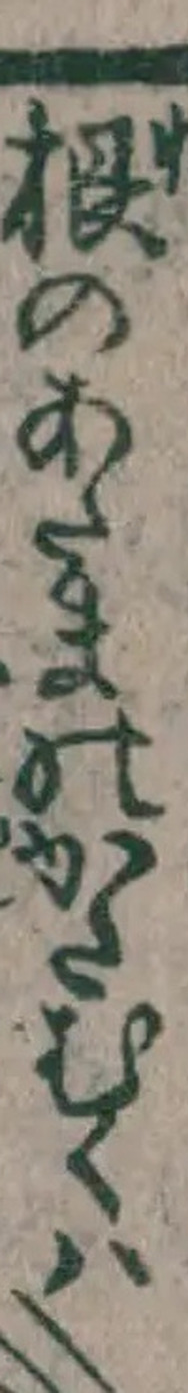根のあたまのかたむくは
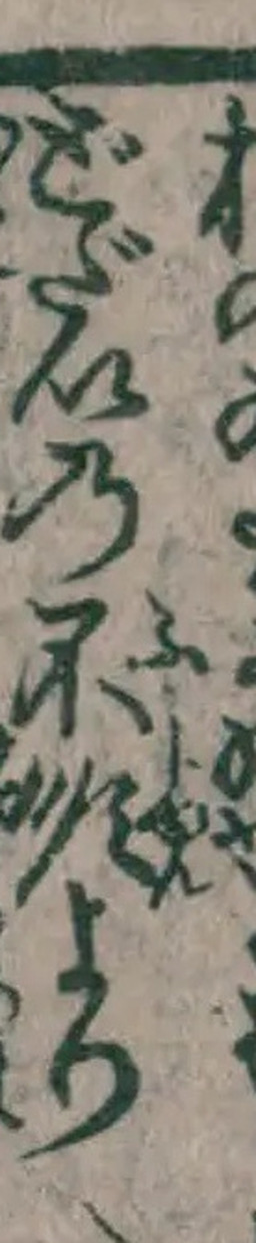どだいの不順より
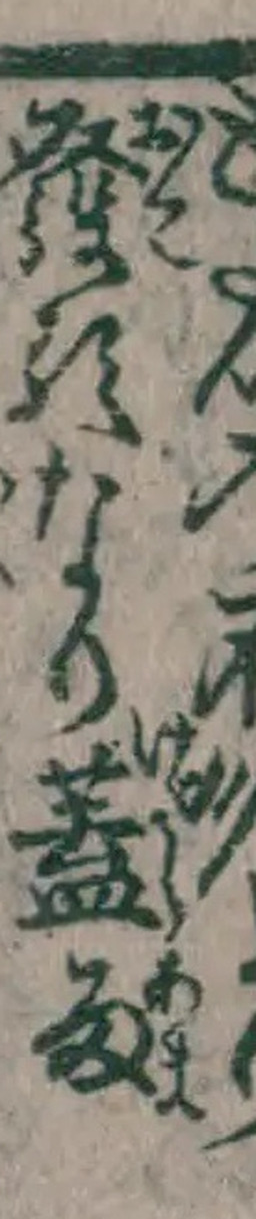発るなり蓋雨
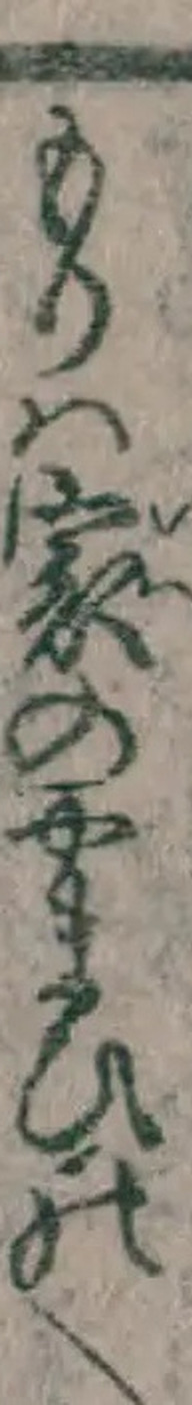もりは家のやまひの
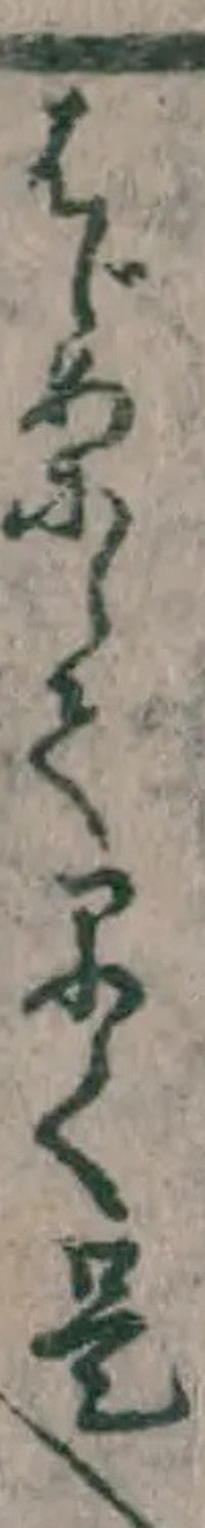はじめにして早く是
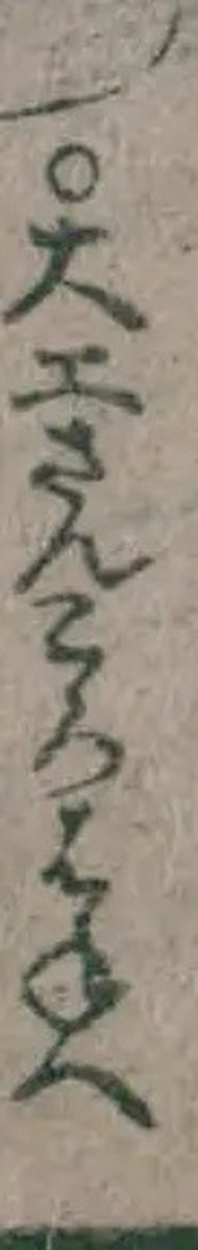○大工さんころはねへ
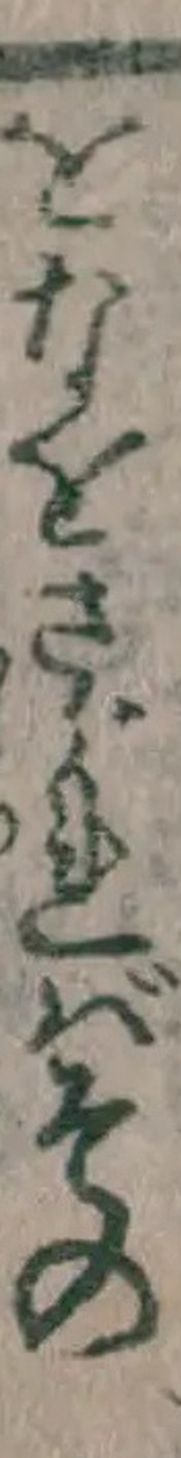をなをさゞればその
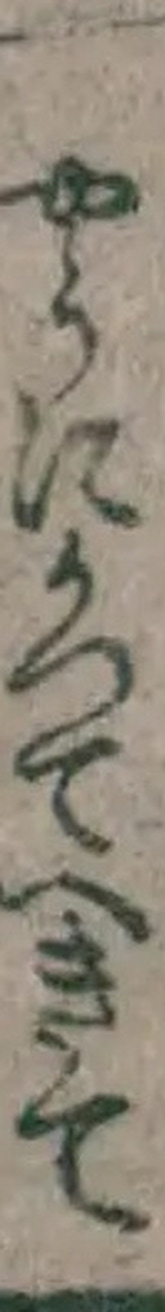やうにかつてへきて
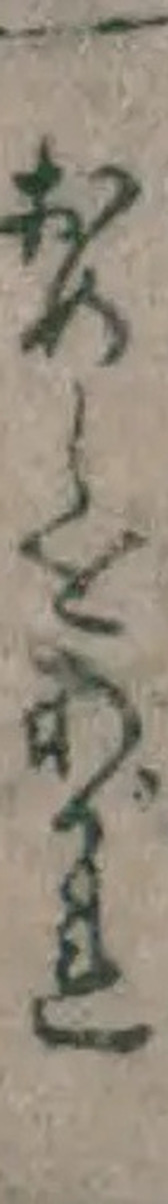おめしをあがれ
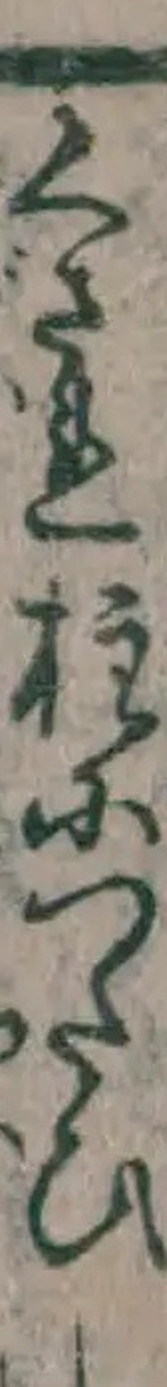くされ柱につたひ
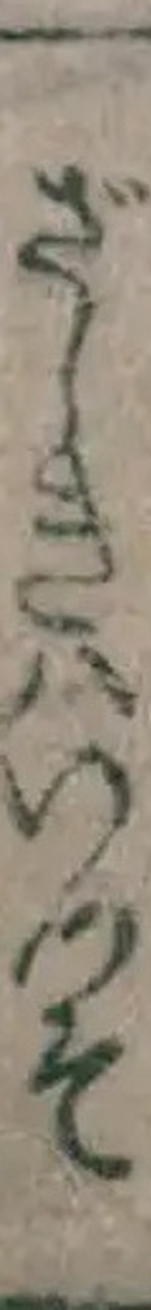ざしきはいつそ
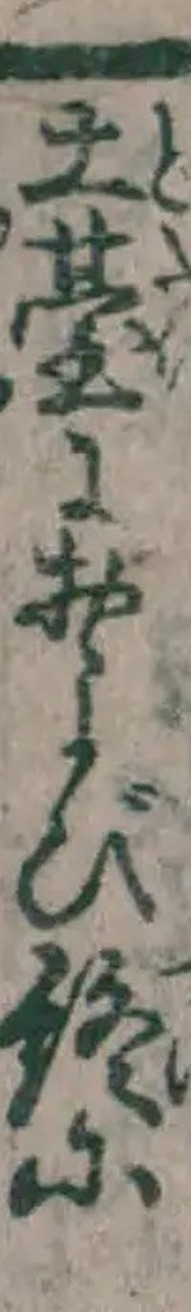土台におよび終に
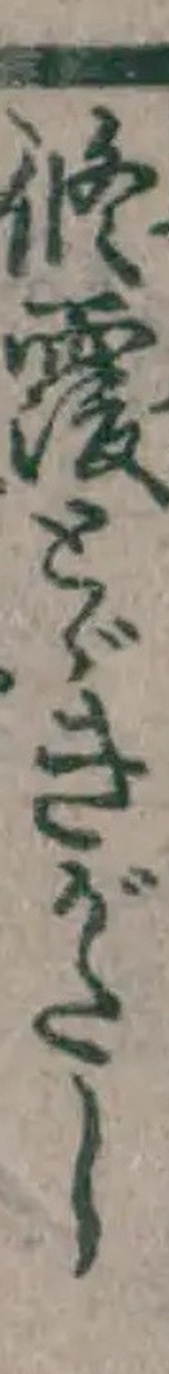修覆とゞきがたし
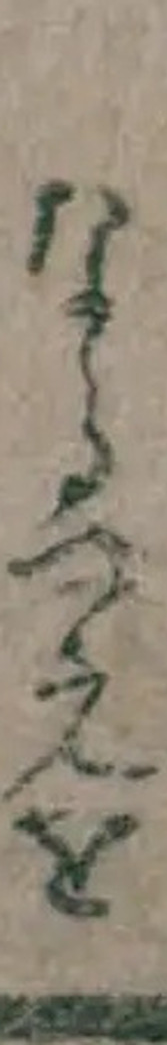なるつえを
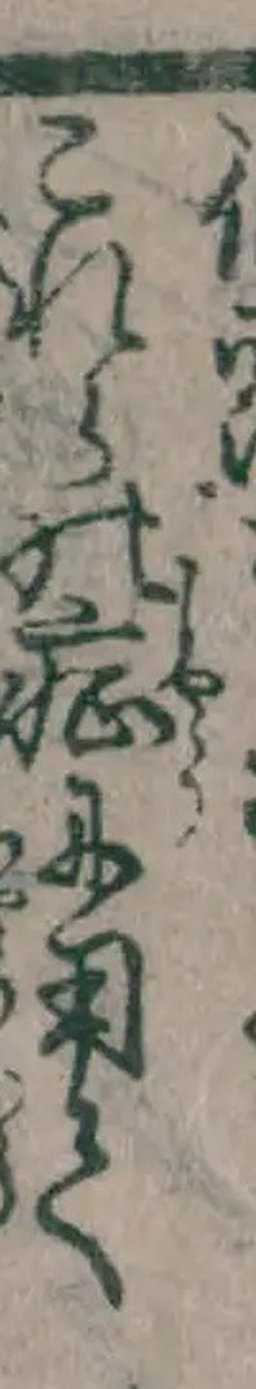これらの症に用て
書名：視薬霞報条 3巻
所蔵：国立国会図書館 National Diet Library, JAPAN
